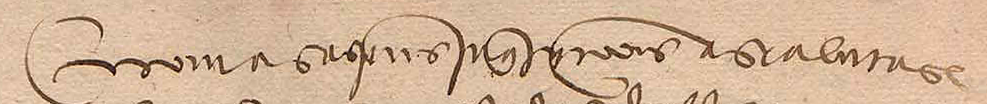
E com as ajues Jnqs̄yçõoes asy abertas e
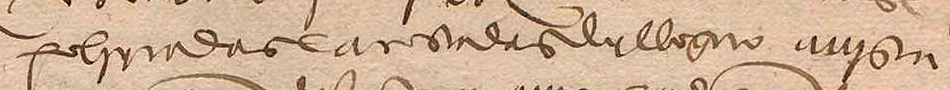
pobrycadas e acostadas dey lloguo a ujsta
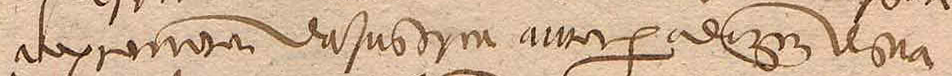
ao promotor da Justyça autor ꝑa dizer de sua
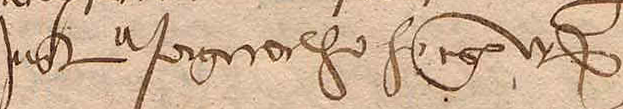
Justa Jorge coelho ho esp̄vy
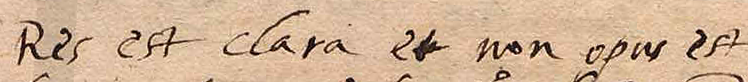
Res est clara et non opus est
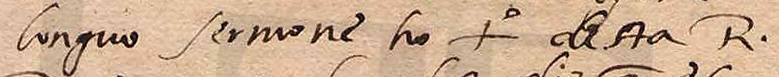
longuo sermone ho to desta R.
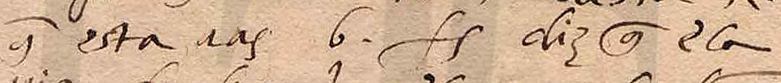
q̄ esta aas 6. fꝭ diz q̄ ela
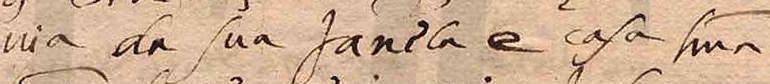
uia da sua Janela e casa hūa
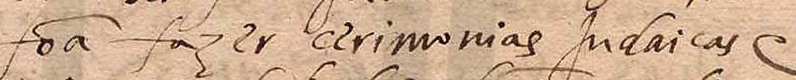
foā fazer cerimonias Judaicas e
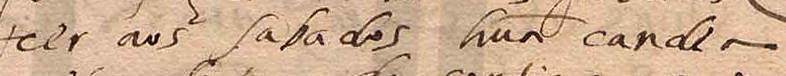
teer aos sabados huā candea
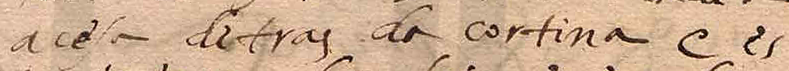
acesa detras da cortina e es
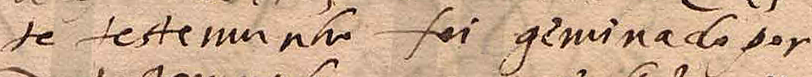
te testemunho foi geminado por
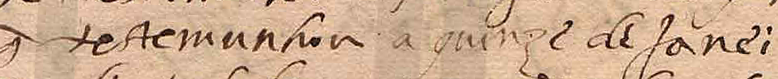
q̄ testemunhou a quinze de Janei
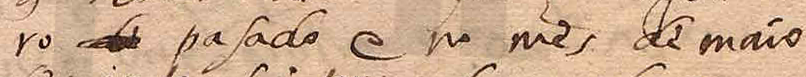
ro de passado e no mes de maio
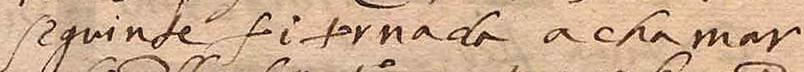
seguinte foi tornada a chamar
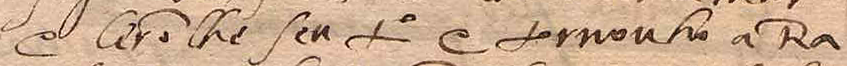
e lerō lhe seu to e tornou ho a Ra
